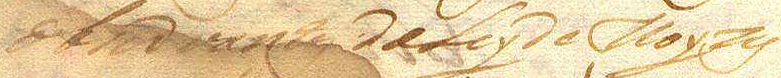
observantes da Ley de Moyzes
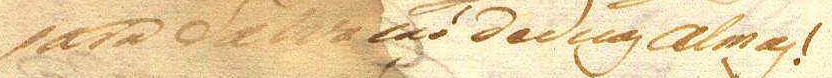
para salvaçaõ de suas almas?
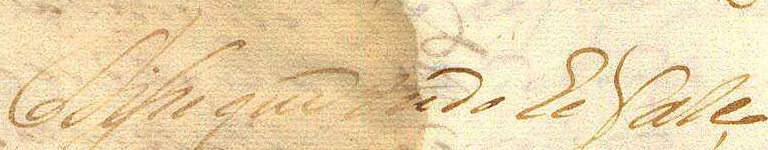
Disse que tudo he falço
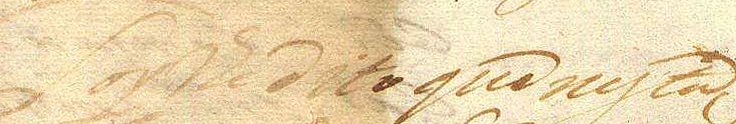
Foy lhe dito que nesta
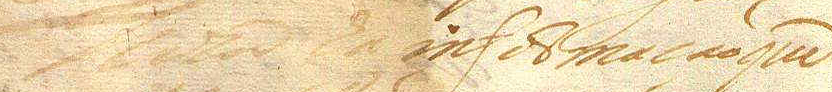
Meza ha informaçaõ que
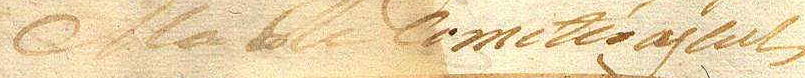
ella Re cometeo as cul
